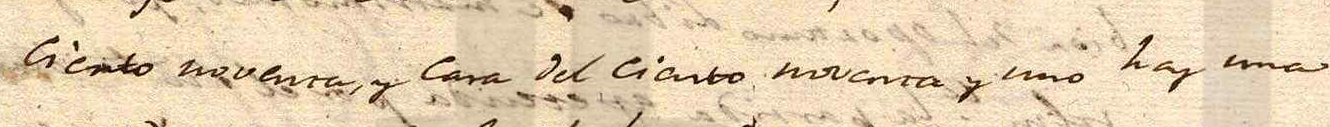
ciento noventa, y cara del ciento noventa y uno hay una
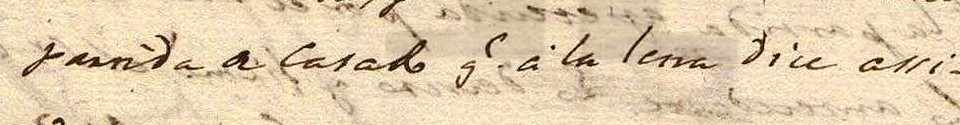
partida de casado qe. a la letra dice assi
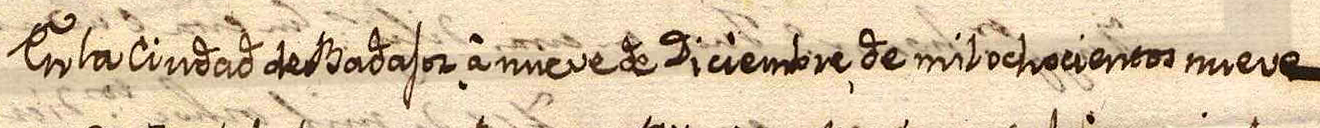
En la ciudad de Badajoz, á nueve de Diciembre, de mil ochocientos nueve
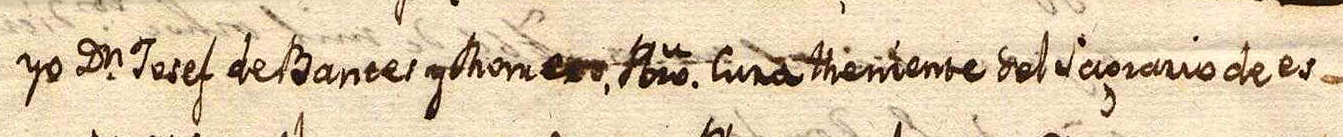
yo D.n Iosef de Bantes y Romero, Pbrō. Cura theniente del sagrario de es
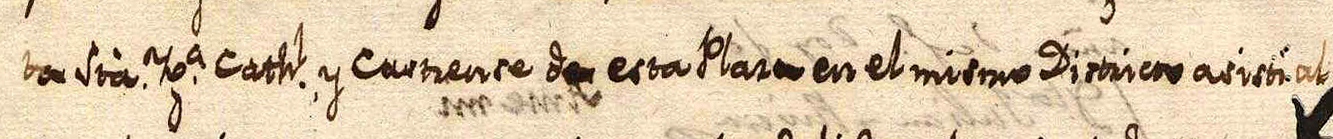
ta Stā Yg.a Cathl. y Castrense de esta Plaza en el mismo Disticto asisti al
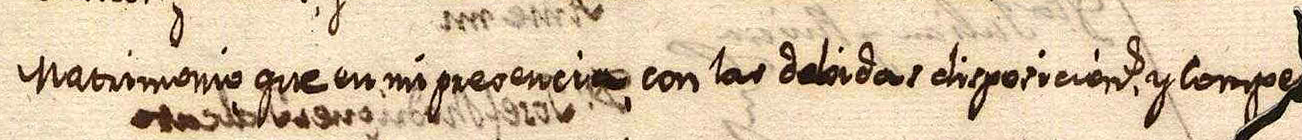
Matrimonio que en mi presencia, con las debidas disposicions, y compe
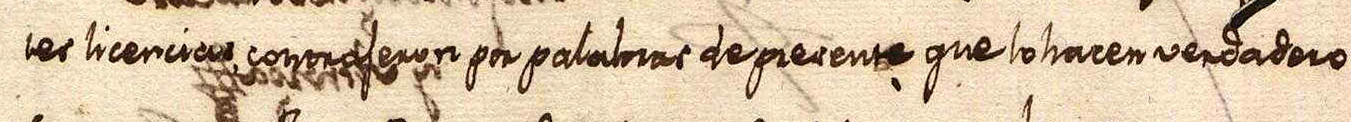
tes licencias, contrajeron por palabras de presente que lo hacen verdadero
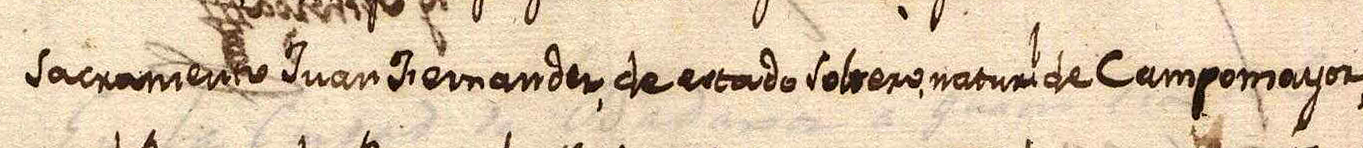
sacramento Iuan Fernandez, de estado soltero, natural de Campo mayor,
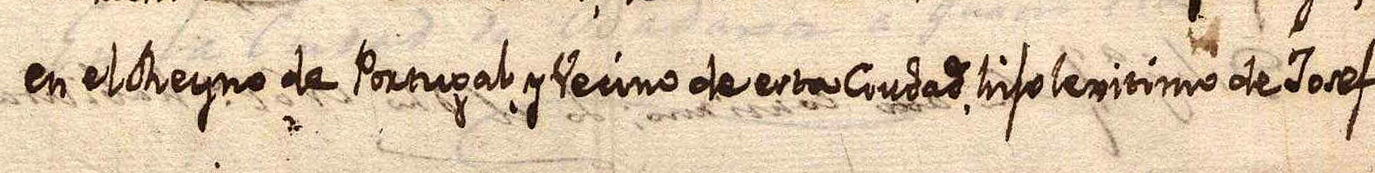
en el Reyno de Portugal, y Vecino de esta Ciudad, hijo lexitimo de Iosef
